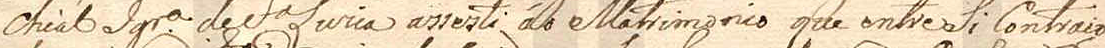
chial Igr.a de sta Luzia assesti ao Matrimonio que entre si Contraio
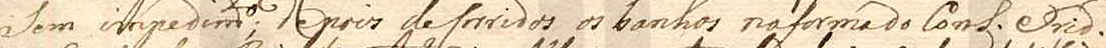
sem impedim.to; depois de Corridos os banhos na forma do Cons. trid.
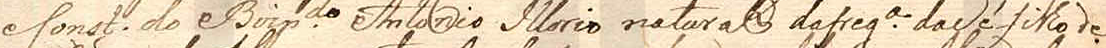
e Const. do Bisp.do Antonio Illario natural da freg.a da sé filho de
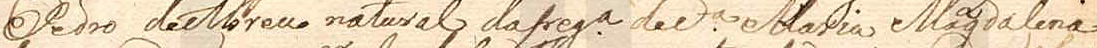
Pedro de Abreu natural da freg.a de s̄a. Maria Magdalena
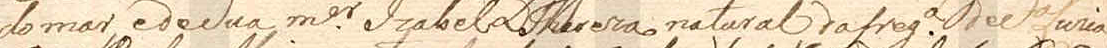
do mar, e de sua m.er Izabel Thereza natural da freg.a de sa Luzia
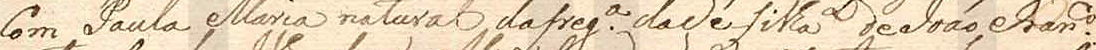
Com Paula Maria natural da freg.a da sé filha de Ioão Fran.co
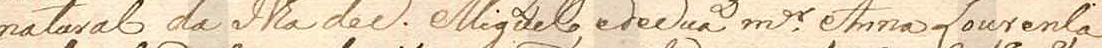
natural da Ilha de s. Miguel, e de sua m.er Anna LourenÇa
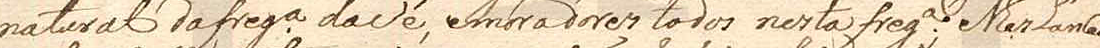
natural da freg.a da sé, e moradores todos nesta freg.a; e lhes lanCei
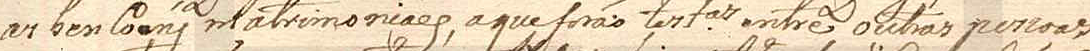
as benCoens matrimoniaes, a que forão test.as entre outras pessoas
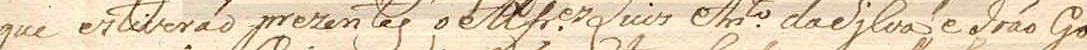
que estiverão prezentes o Alf.es Luis Ant.o da Silva e Ioão Go
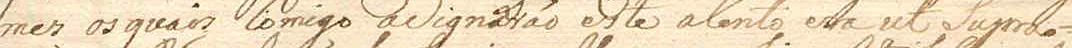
mes os quais Comigo asignarão este aCento era ut supra
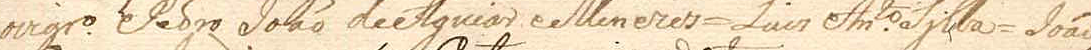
o vigr.o Pedro Ioaõ de Aguiar e Menezes= Luiz An.to Sjlva= Ioão
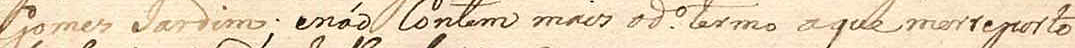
Gomes Iardim; e não Contem mais o d.o termo a que me rreporto
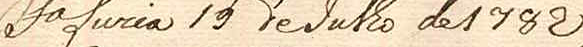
s̄.a Luzia 19 de Iulho de 1782
